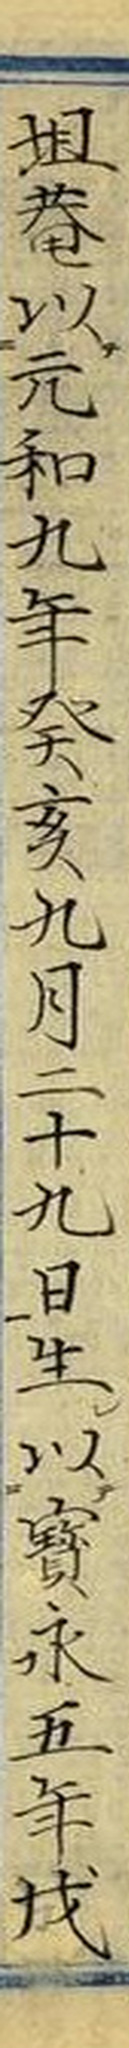坦庵以元和九年癸亥九月二十九日生以寶永五年戊
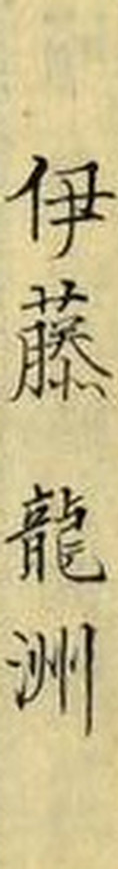伊藤瀧洲

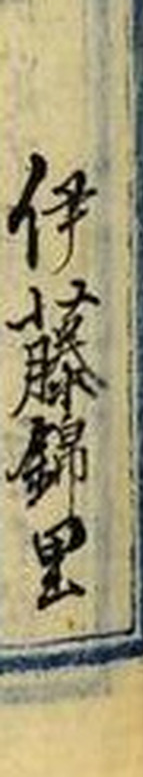伊藤錦里

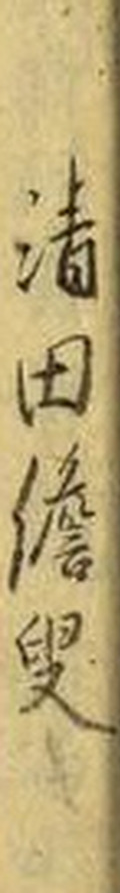清田儋叟
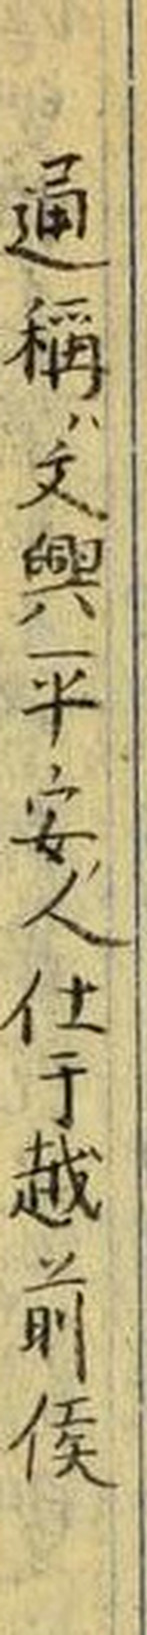通稱文興平安人仕于越前侯

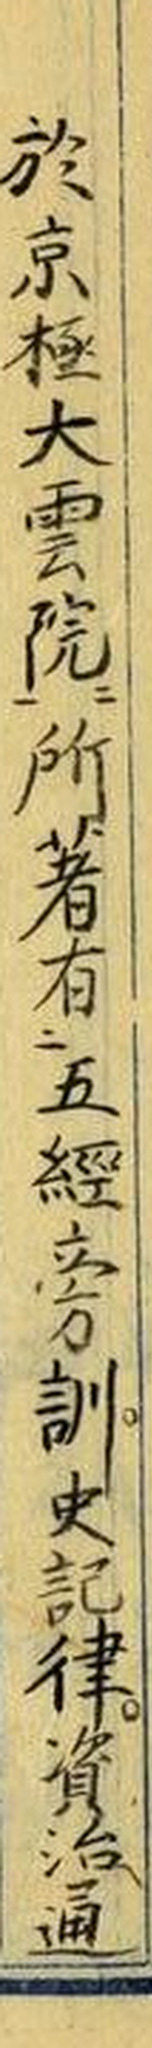於京極大雲院所著有五經旁訓。史記律。資治通
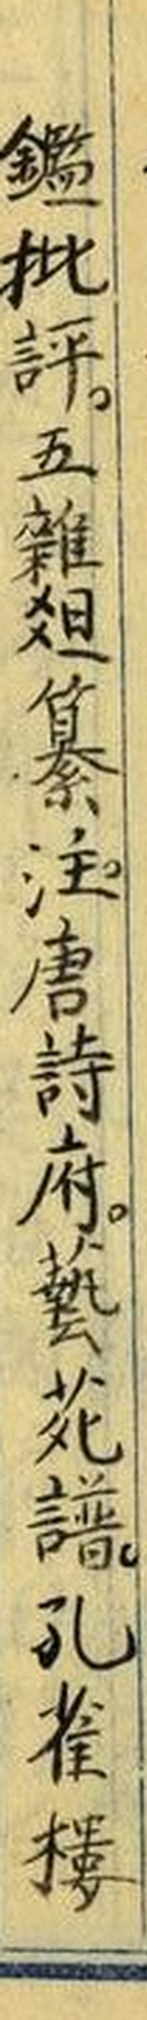鑑批評。五雜俎纂注。唐詩府。藝苑譜。孔雀樓
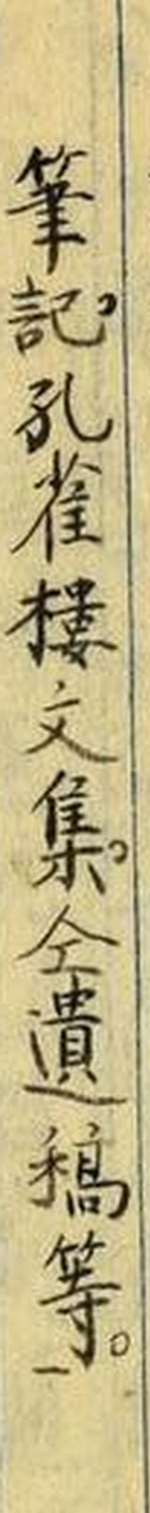筆記。孔雀樓文集。仝遺稿等。

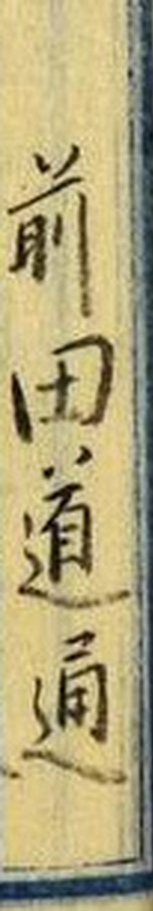前田道通
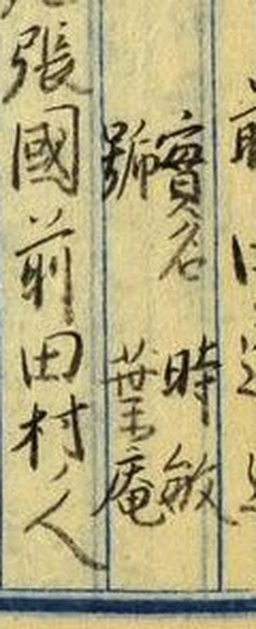號葉庵
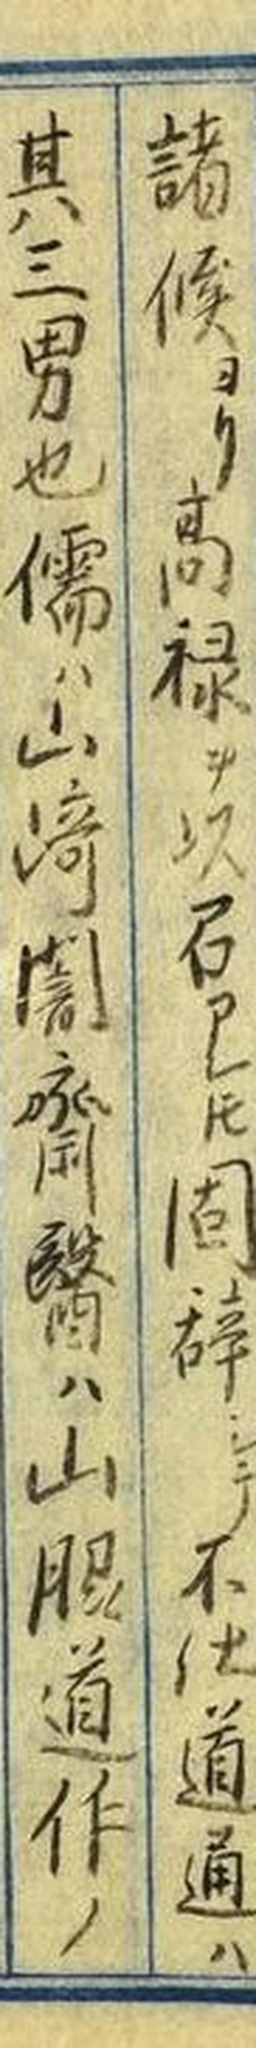其三男也儒山﨑闇齋醫山脇道作

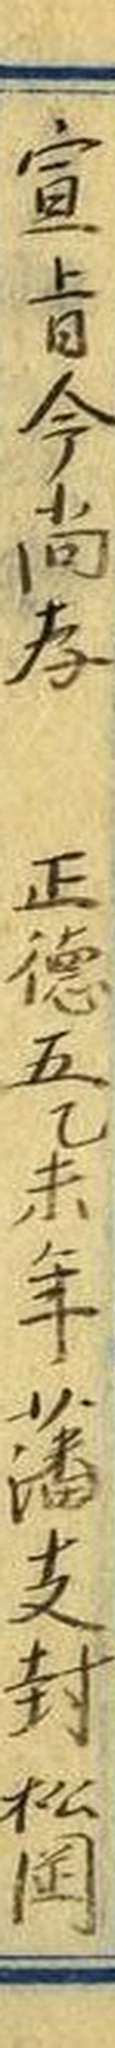宣旨今尚存正徳五乙未年藩支封松岡
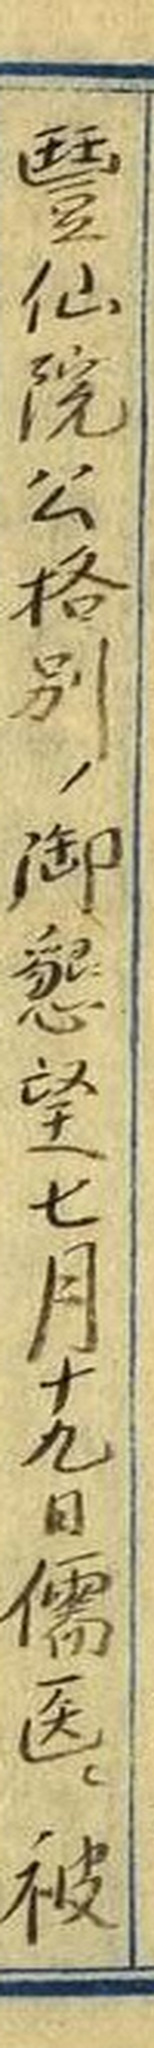豐仙院公格別御懇望七月十九日儒医被
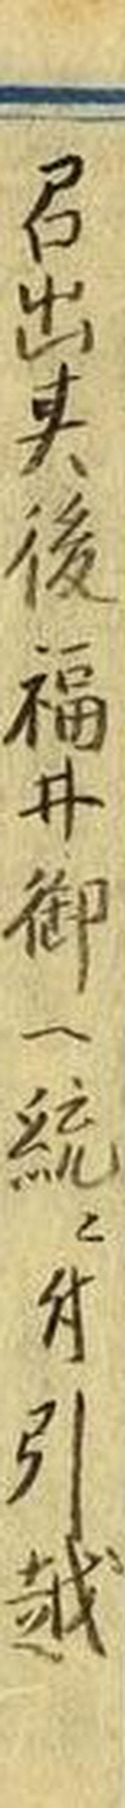召出其後福井御一統付引越
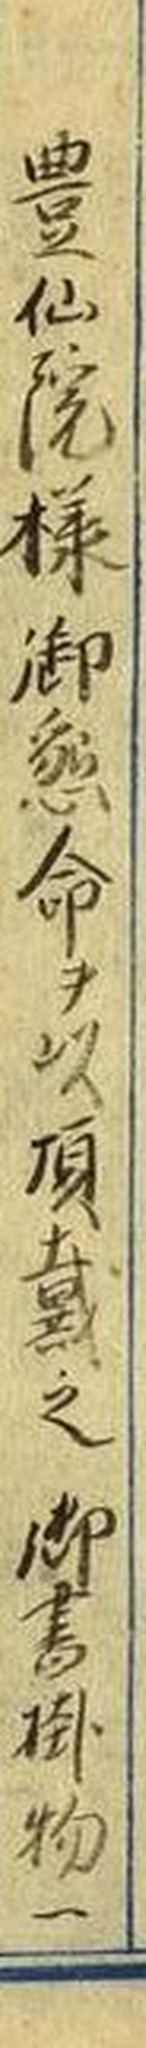豊仙院様御懇命以頂戴之御書掛物一
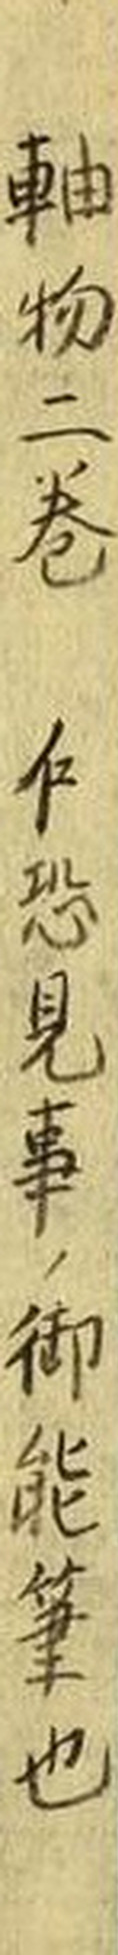軸物二巻乍恐見事御能筆也
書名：温古集 四巻
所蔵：福井県文書館 Fukui Prefectural Archives
